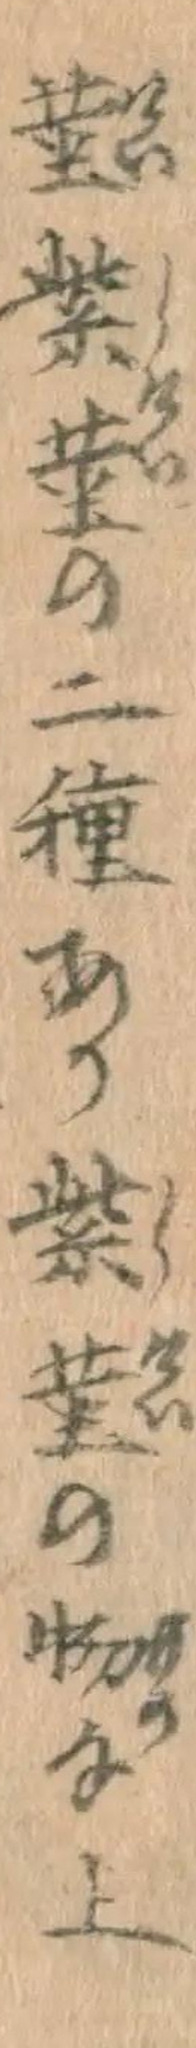茎紫茎の二種あり紫茎の物を上
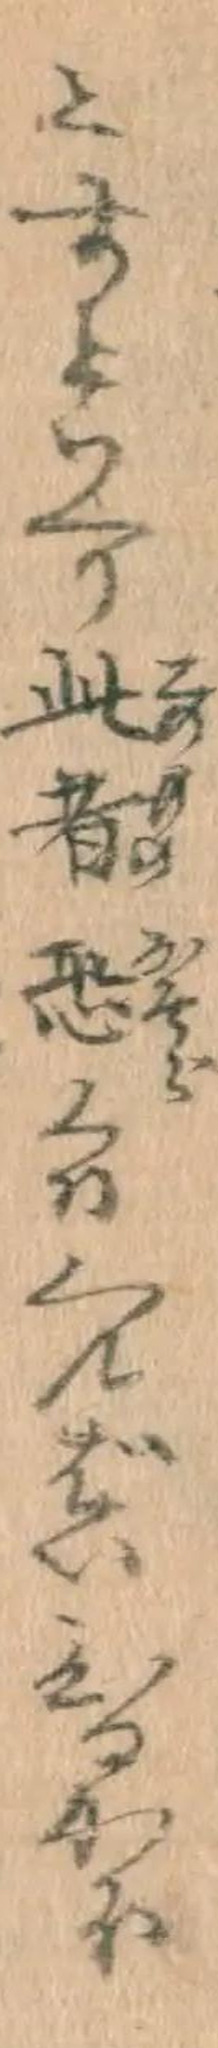とすといへり此者恐くはくんばいひるかほ
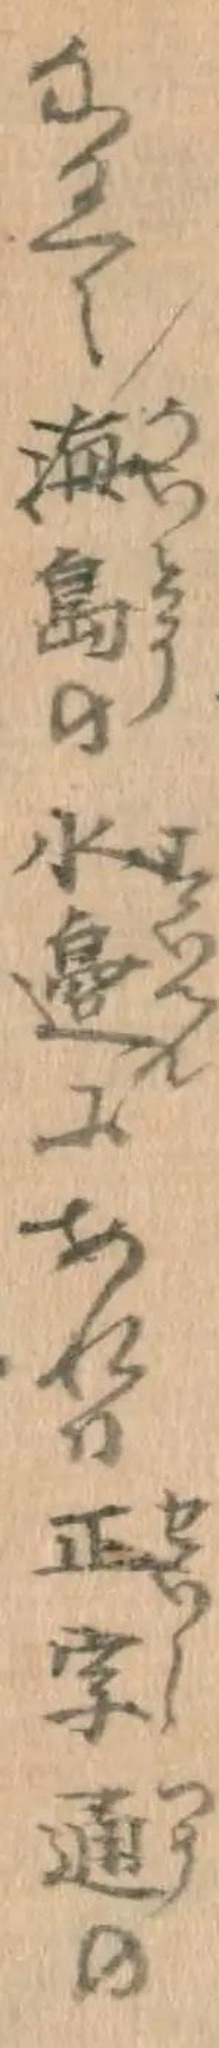なるへし海島の水辺にあれは正字通の
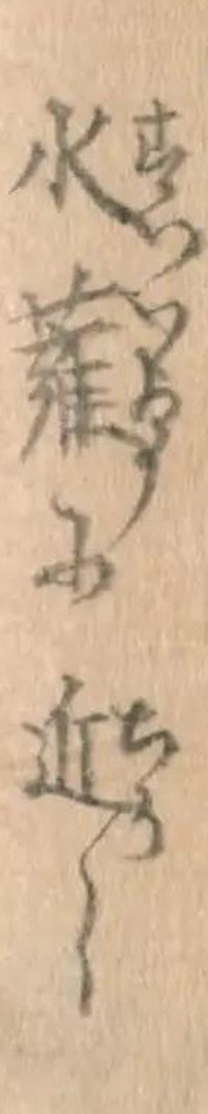水蕹に近し
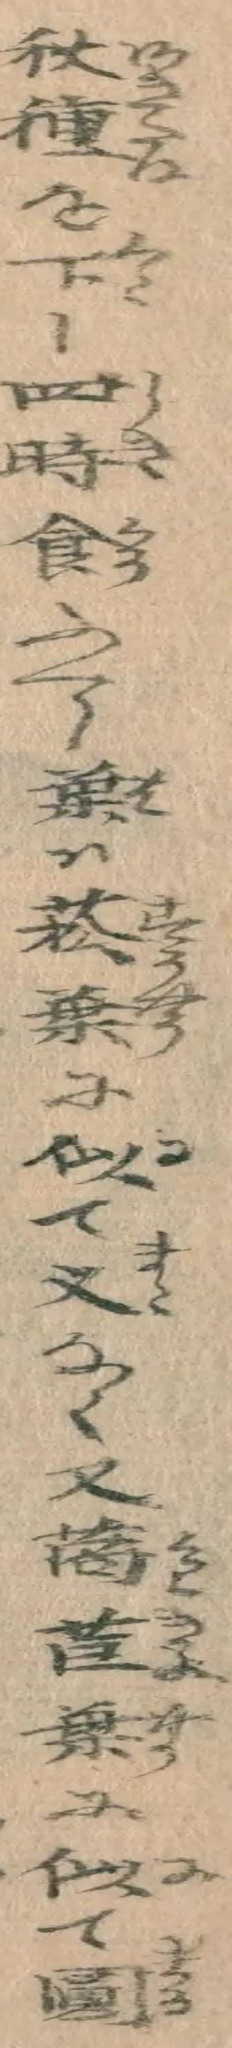秋種を下し四時食ふへし葉は菘葉に似て叉なく又萵苣葉に似て円
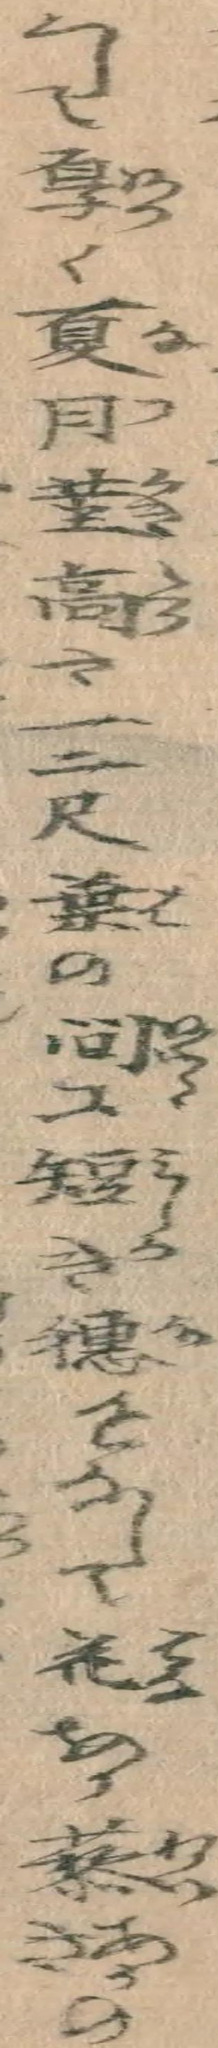くして厚く夏月茎高さ一二尺葉の間に短き穂をなして花あり藜あかさの
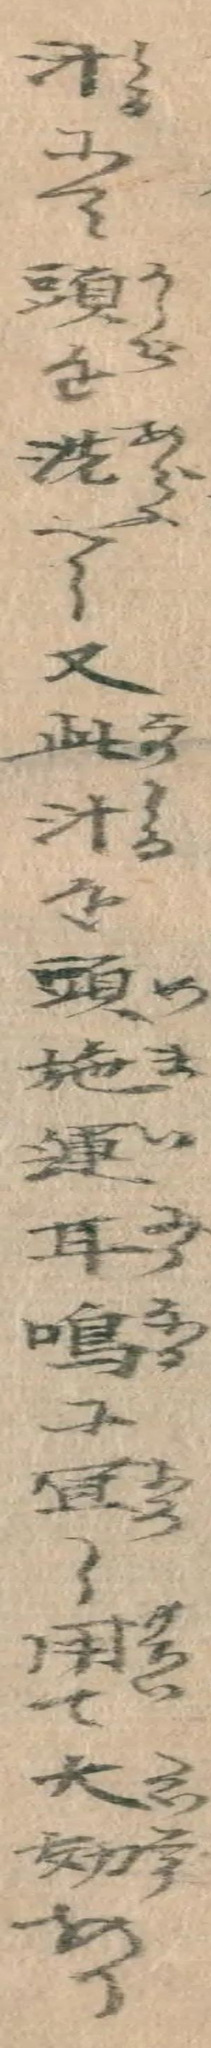汁にて頭を洗へし又此汁を頭施運耳鳴に宜し用て大効あり

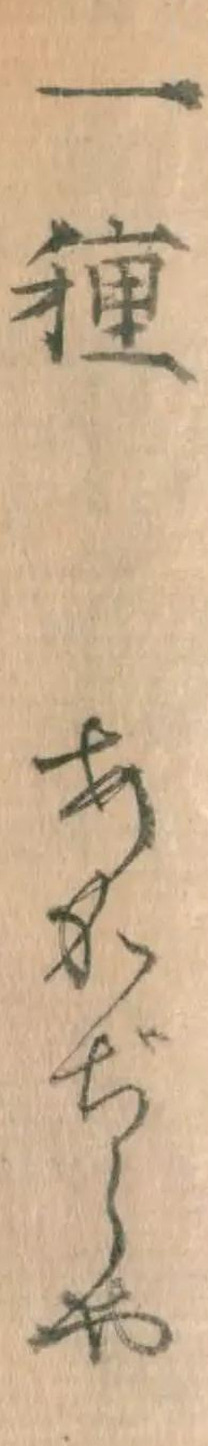一種あかぢしや
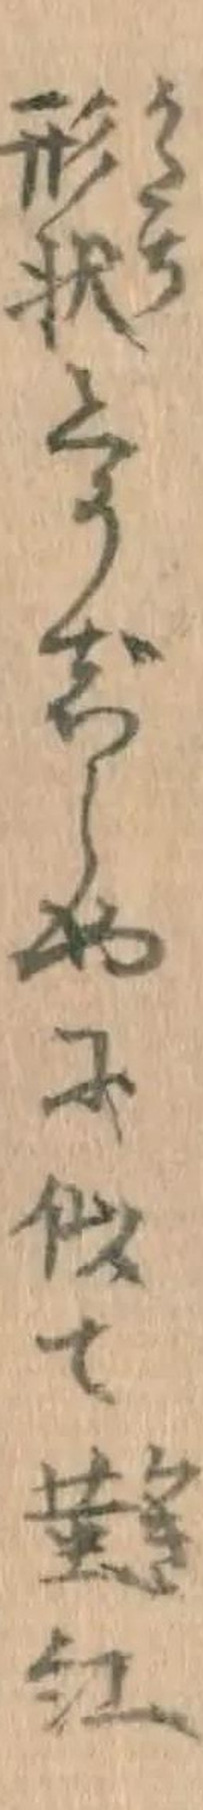形状とうじしやに似て茎紅
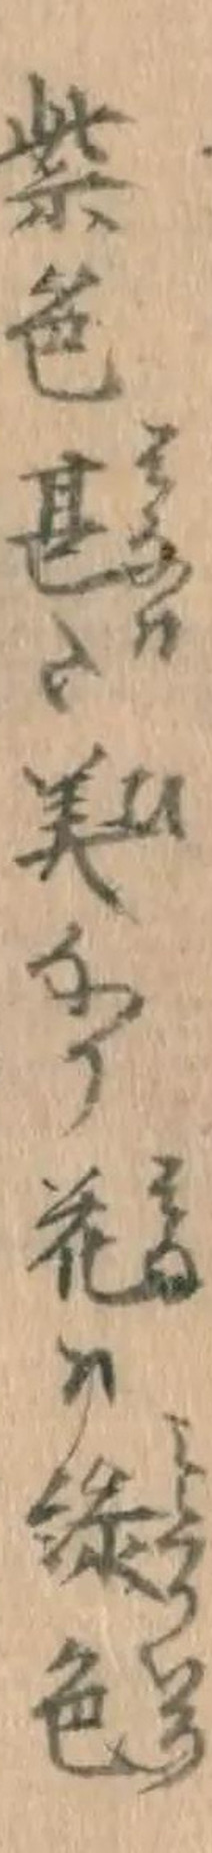紫色甚た美なり花は緑色
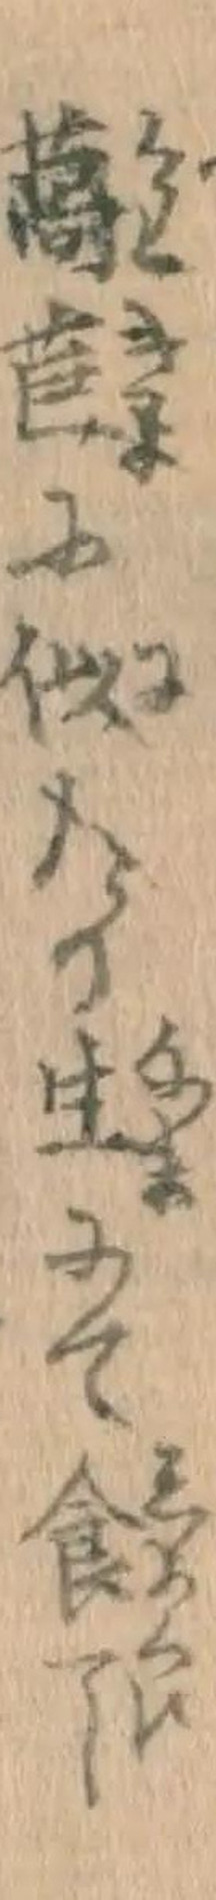萵苣に似たり生にて食へし
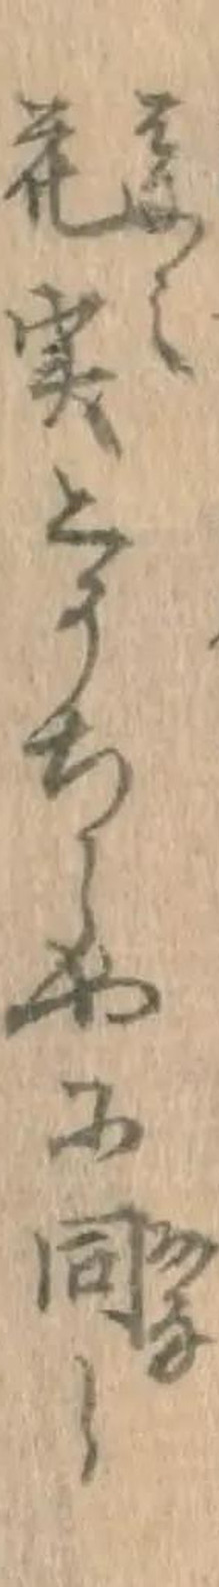花実とうちしやに同し

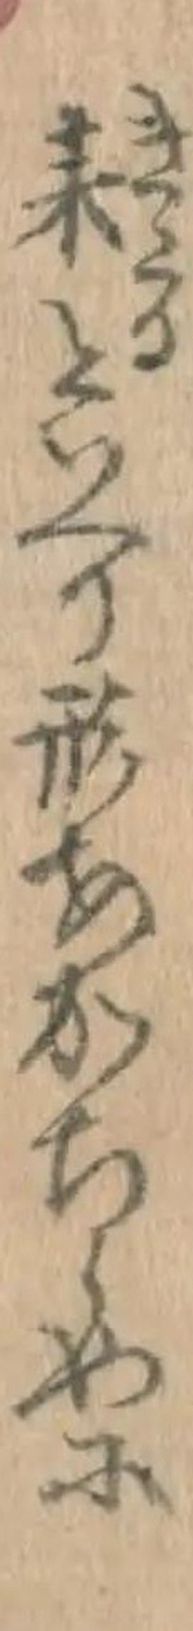来といへり形あかちしやに
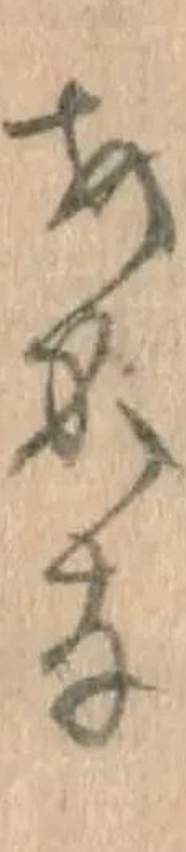あかな
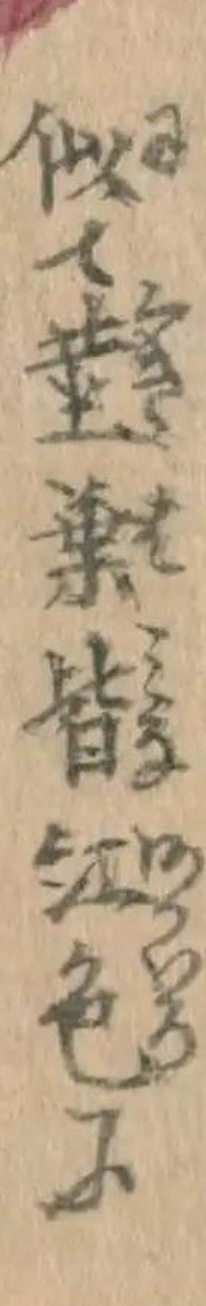似て茎葉皆紅色に
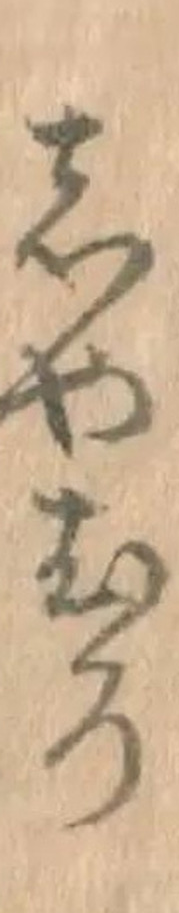しやむろ
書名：本草図譜. 巻46-48
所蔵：国立国会図書館 National Diet Library, JAPAN
